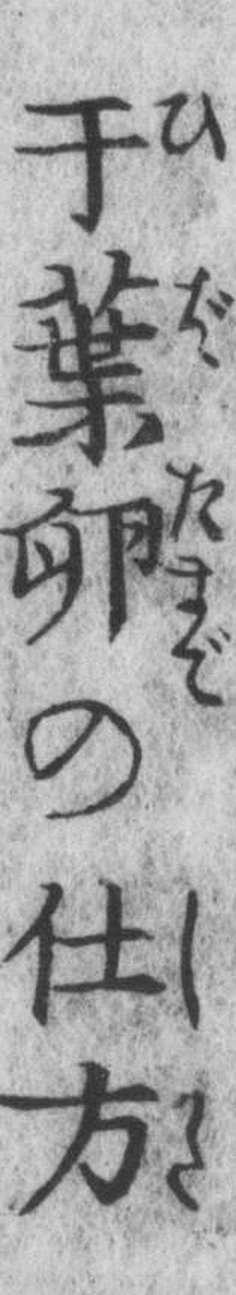干葉卵の仕方
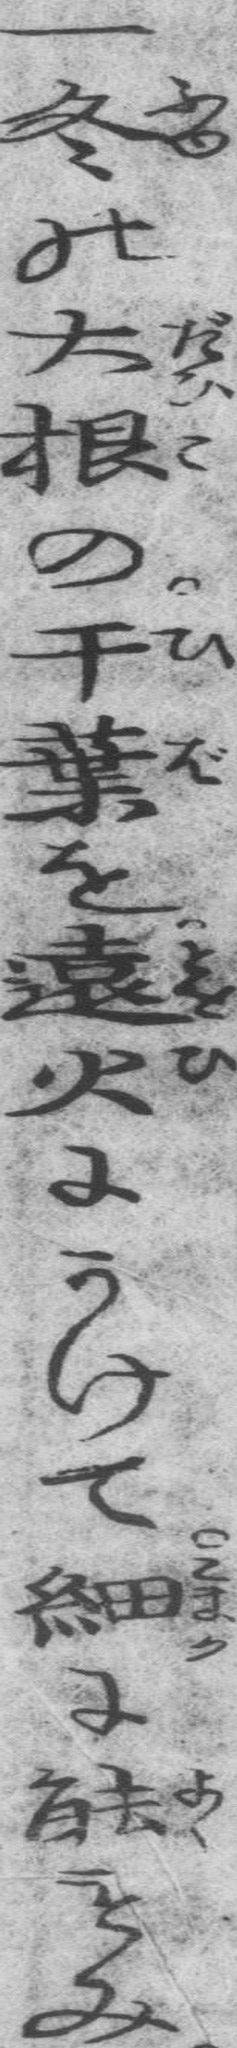一冬の大根の。干葉を。遠火にかけて。細に能もみ。

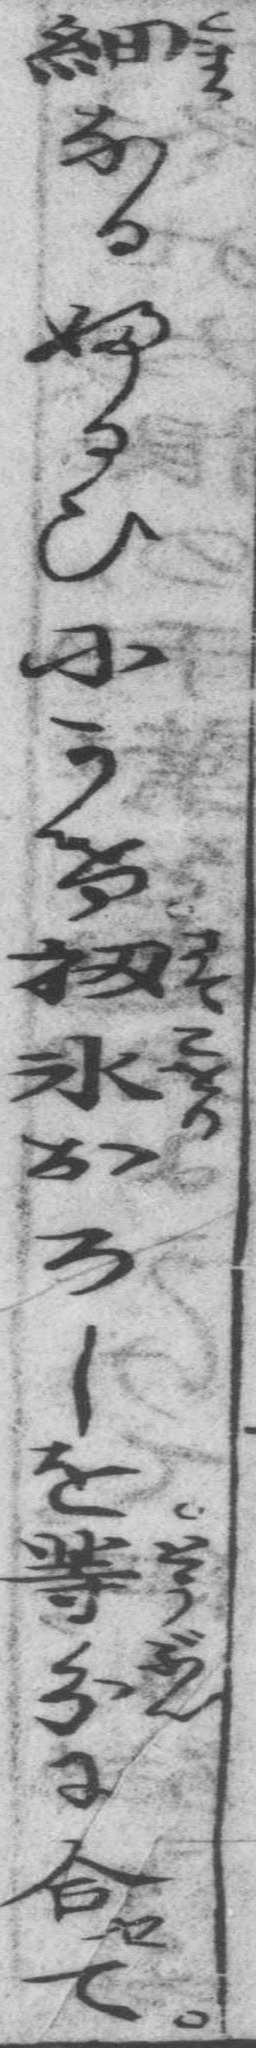細なるふるひにかけ。扨氷おろしを。等分に合せて。
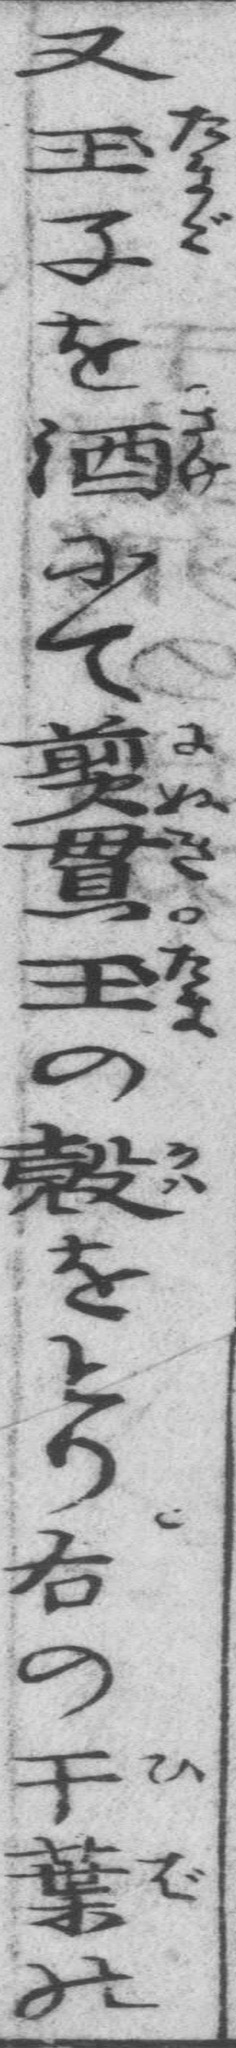又玉子を。酒にて煎貫。玉の殻をとり。右の干葉の
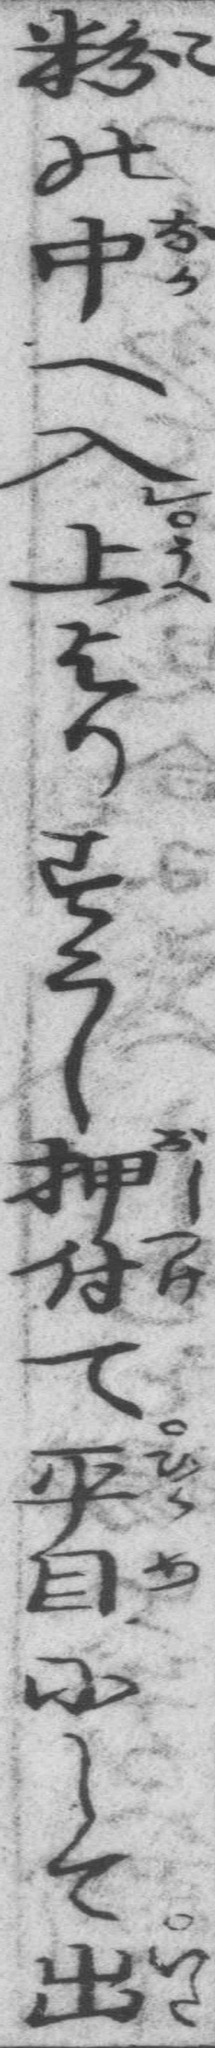粉の中へ入れ。上よりすこし押付て。平目にして。出
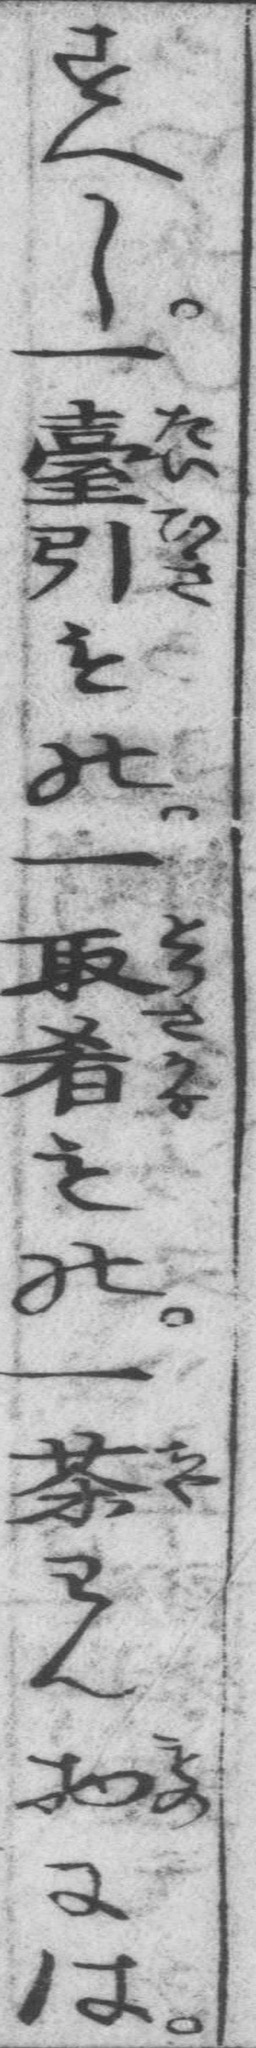すへし。一台引もの。一取肴もの。一茶わん物には。
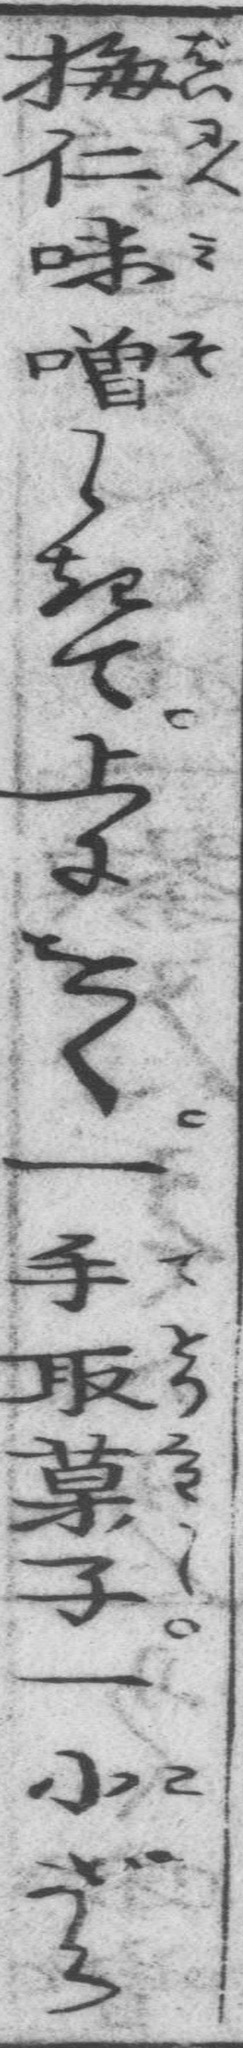梅仁味噌しきて。上にをく。一手取菓子。一小ざら
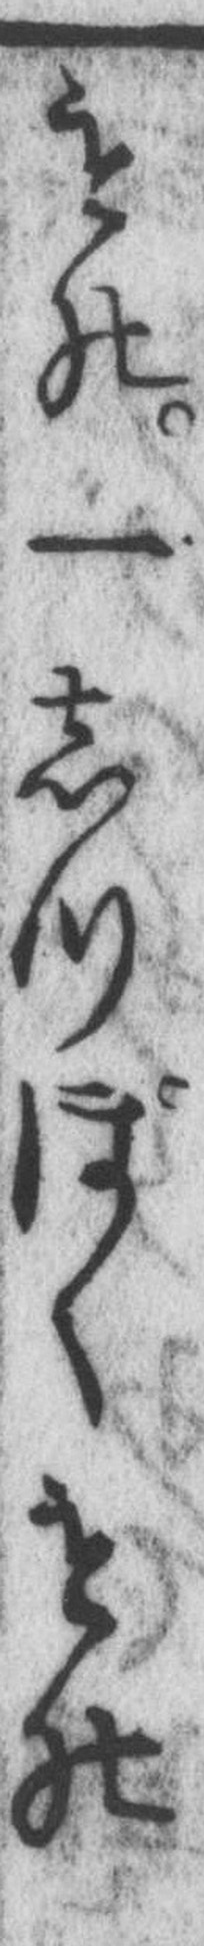もの。一しつぽくもの
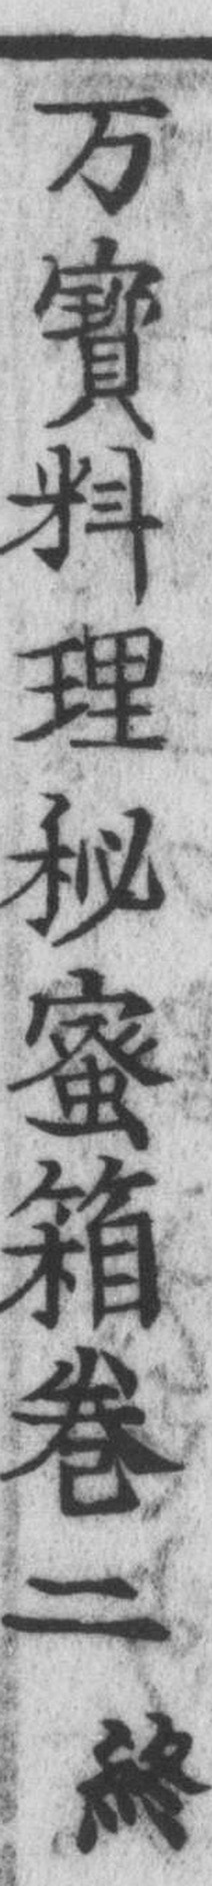万宝料理秘密箱巻二終

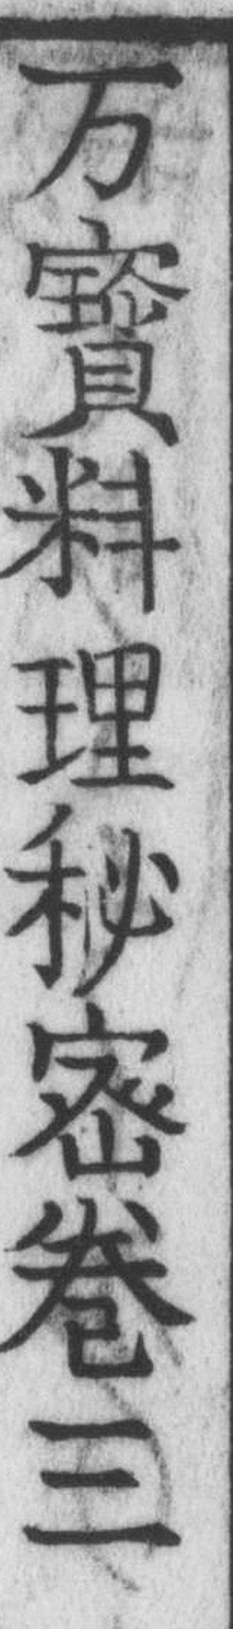万宝料理秘密巻三
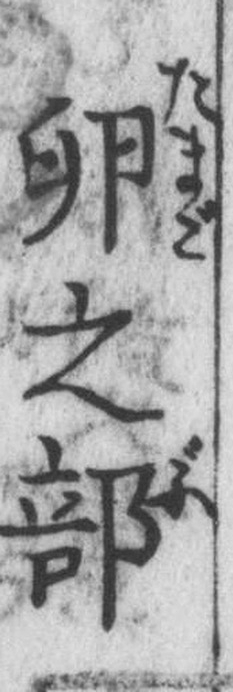卵の部
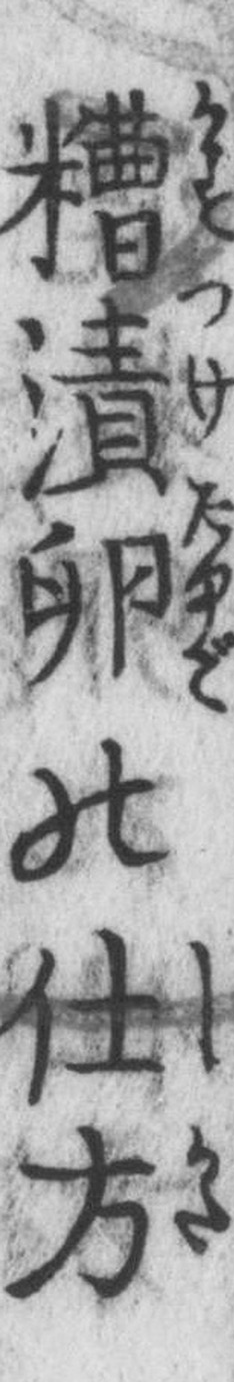糟漬卵の仕方
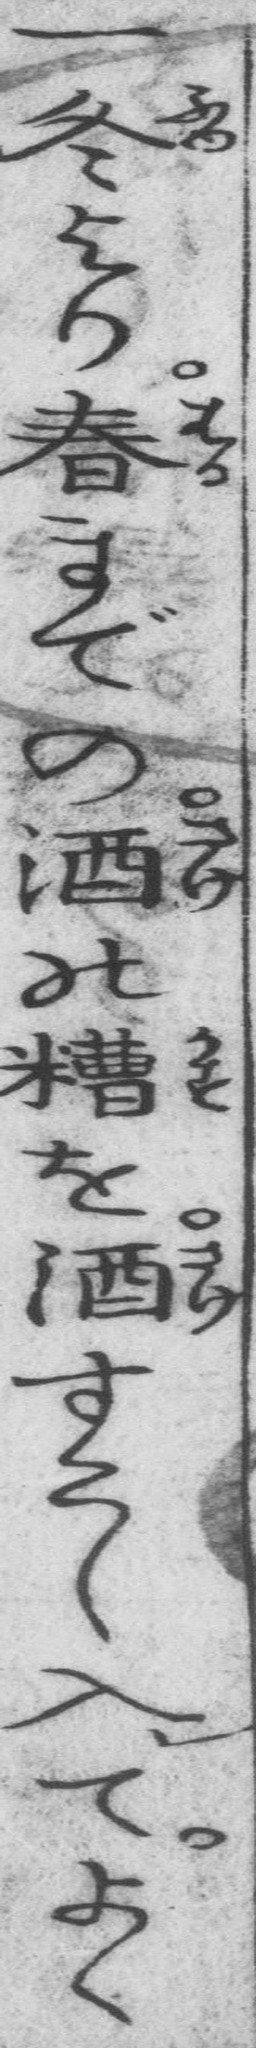一冬より。春までの。酒の糟を。酒すこし入れて。よく
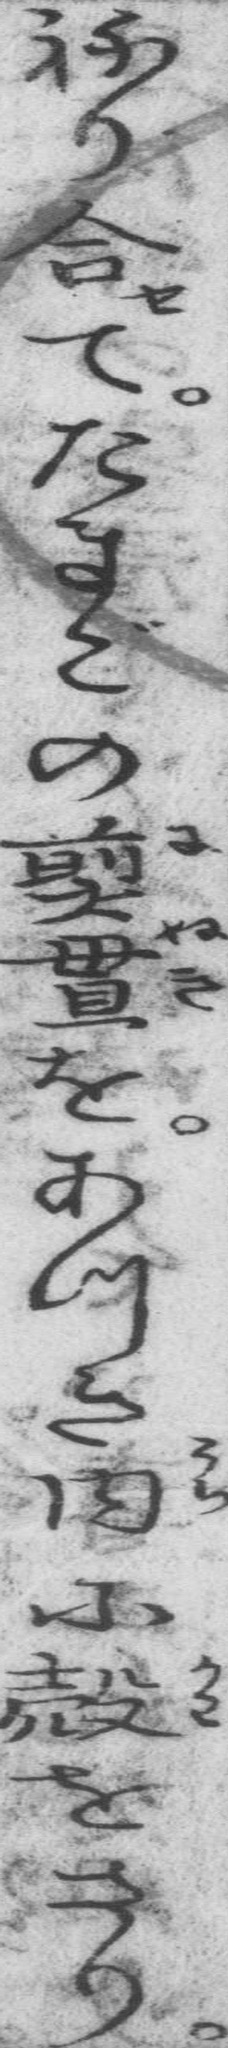ねり合せて。たまごの煎貫を。あつき内に殻をさり。
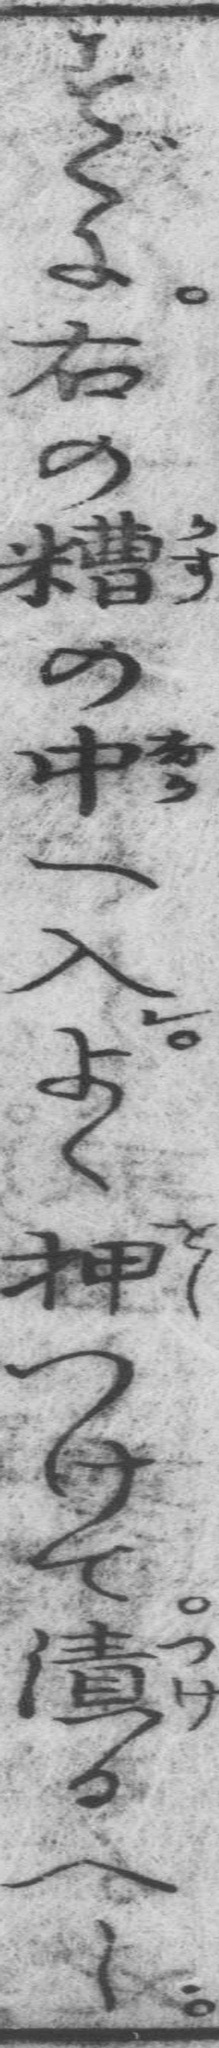すぐに。右の糟の中へ入れ。よく押つけて。漬るへし。
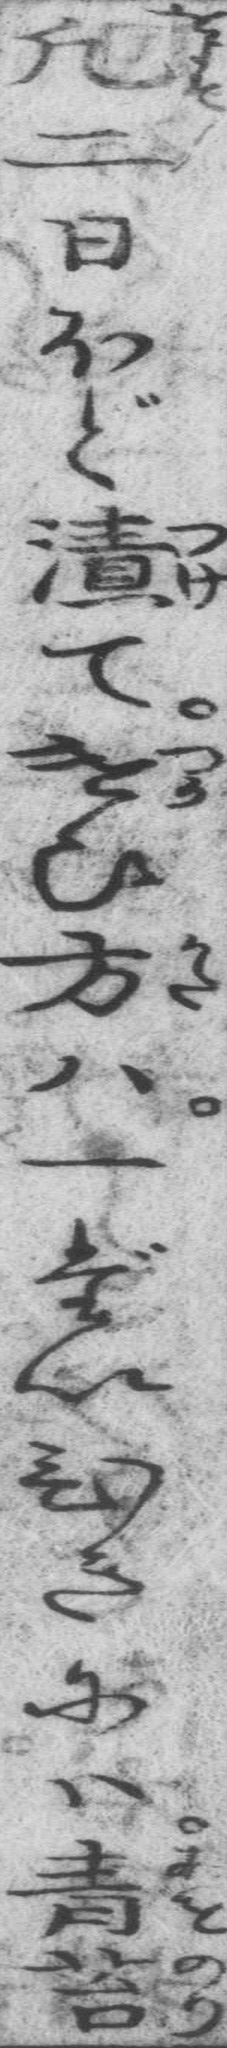凡二日ほど漬て。遣ひ方は。一だいひきには。青苔
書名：萬寳料理秘密箱
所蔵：大阪府立大学学術情報センター 国文学研究資料館
